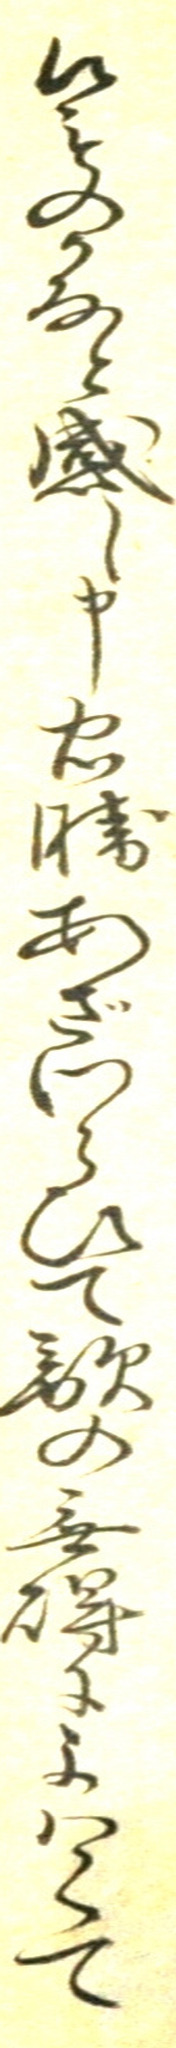候ものかなと感し申忠勝あざわらひて敵の無碍によはくて
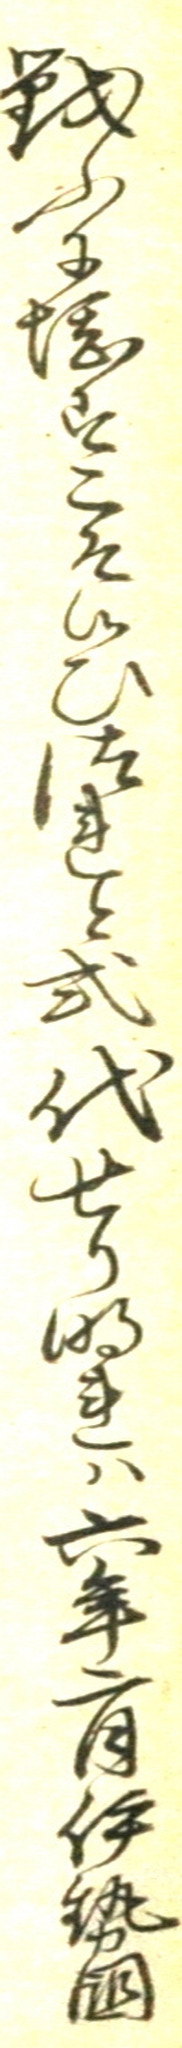戦ふに堪すこそ候ひつれと式代せり明れは六年二月伊勢国
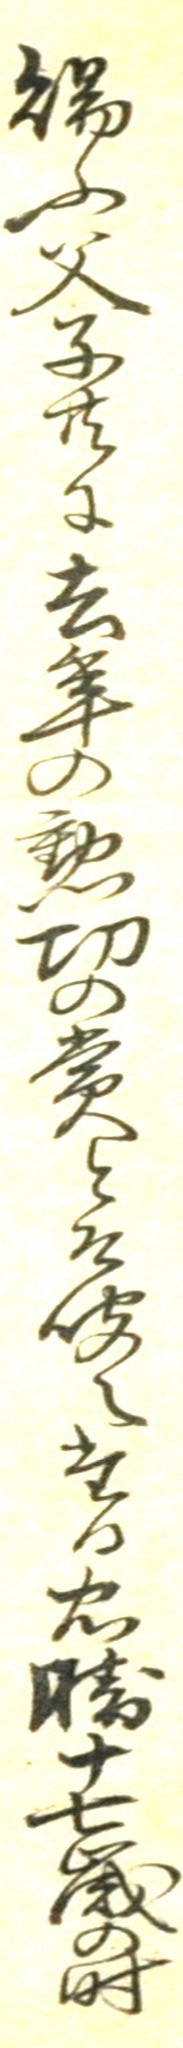賜ふ父子共に去年の勲功の賞とそ聞えたる忠勝十七歳の時
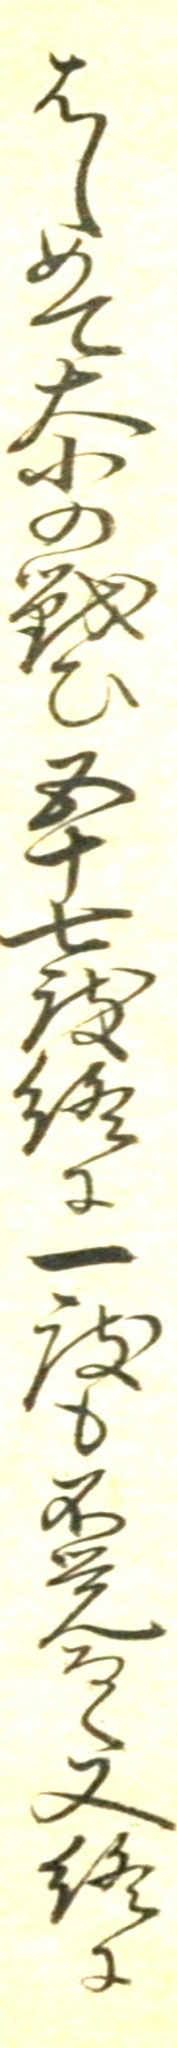はしめて大小の戦ひ五十七度終に一度も不覚なく又終に
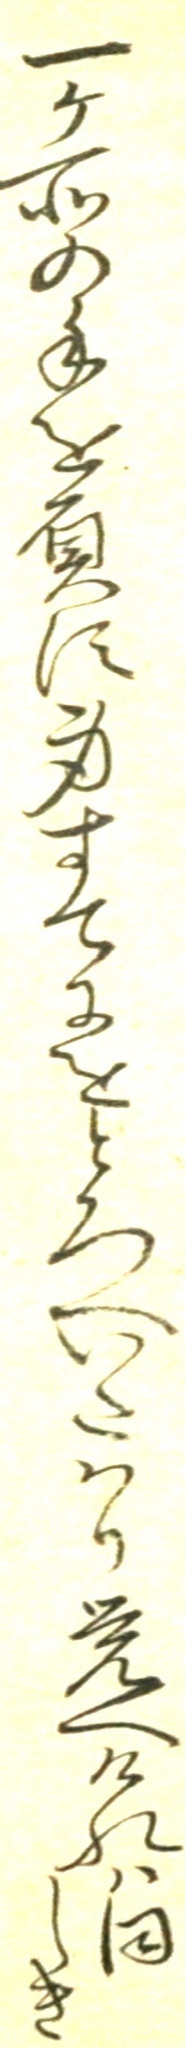一ヶ所の手を負す身すてにをとろへいたはり覚へけれは同しき
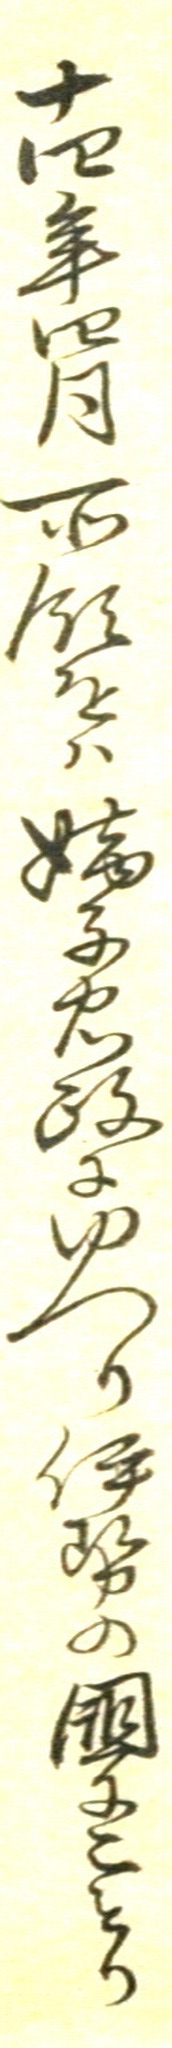十四年四月所領をは嫡子忠政にゆつり伊勢の国にこもり
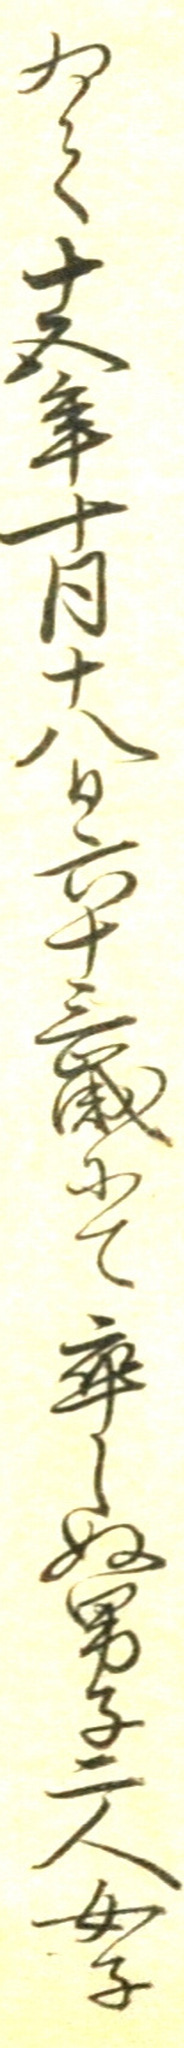ゐて十五年十月十八日六十三歳にて卒しぬ男子二人女子
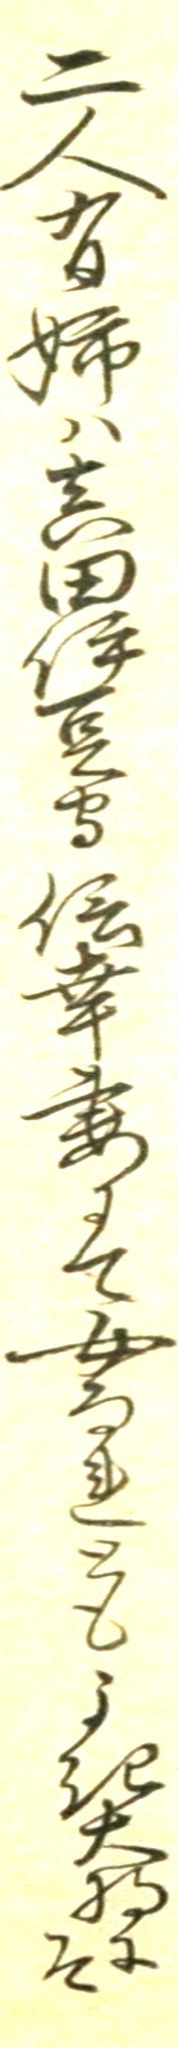二人有姉は真田伊豆守信幸妻にて女なれともよき大将にそ
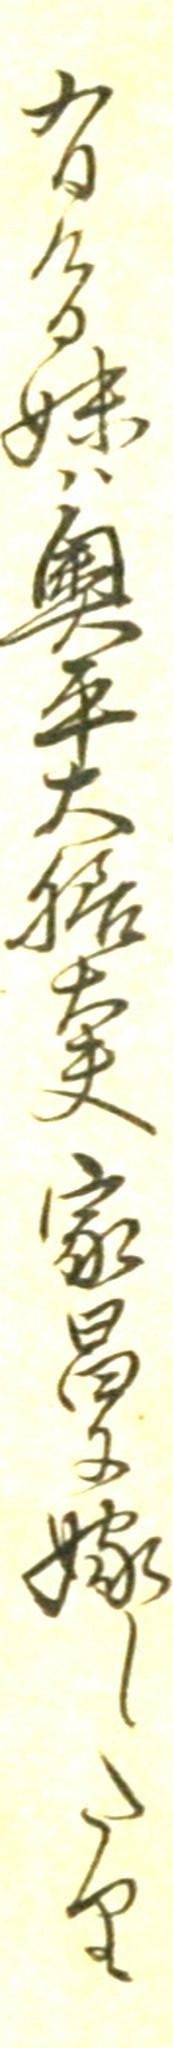有ける妹は奥平大膳大夫家昌に嫁したり
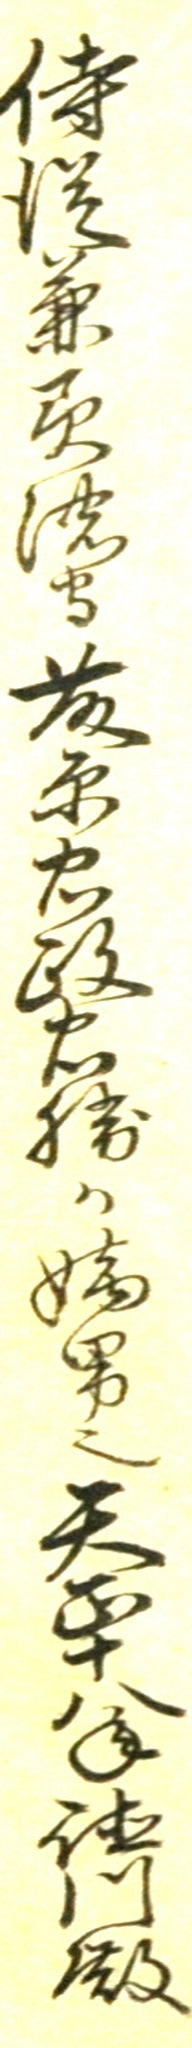侍従兼美濃守藤原忠政忠勝か嫡男也天正十八年徳川殿

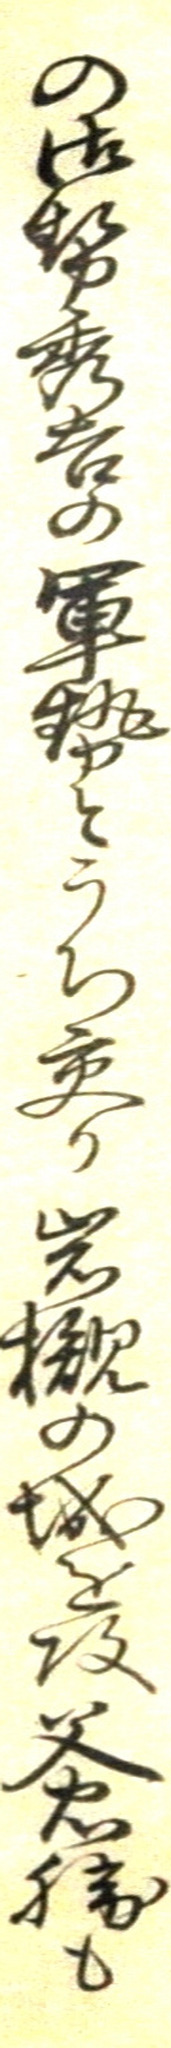の御勢秀吉の軍勢と打ち交り岩槻の城を攻父忠勝も
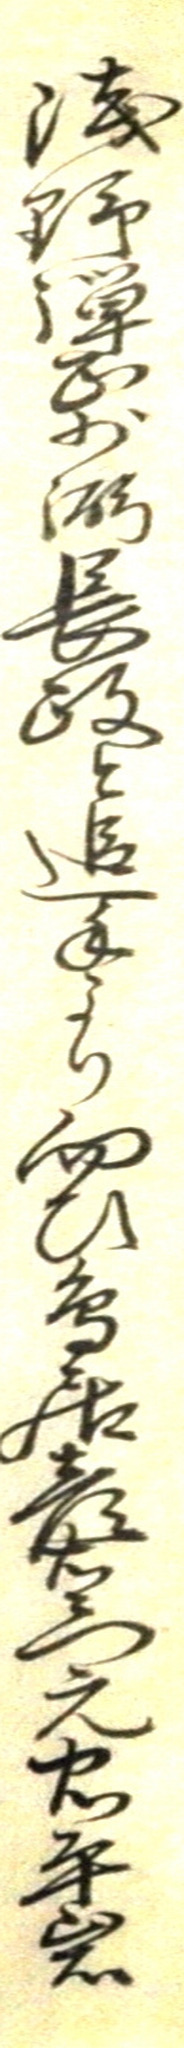浅野弾正少弼長政と追手より向ひ鳥居彦右衛門元忠平岩
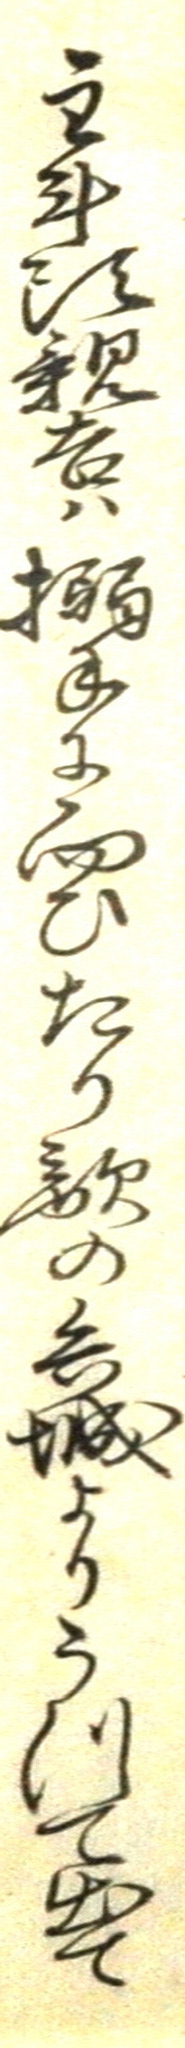主計頭親吉は搦手に向ひたり敵の兵城よりうつて出て
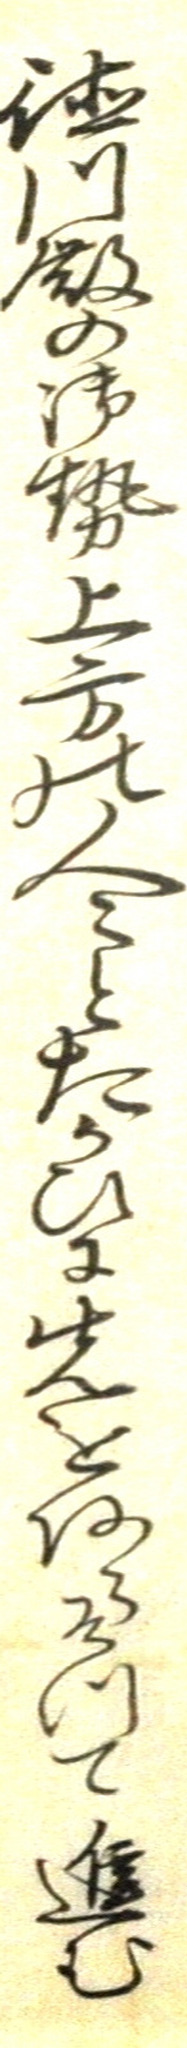徳川殿の御勢上方の人々とたかひに先をあらそつて進む
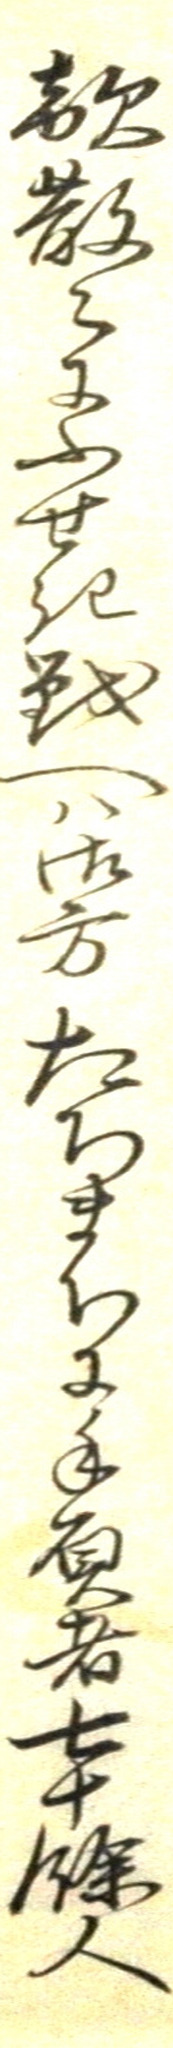敵散々にふせき戦へは御方たちまちに手負者七十余人
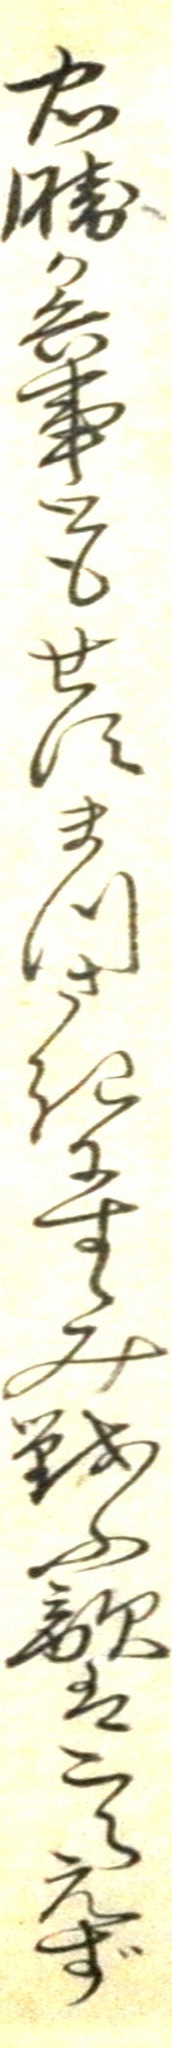忠勝か兵事ともせすまつさきにすゝみ戦ふ敵はこらえず
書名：藩翰譜（四・上）
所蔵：伊那市立高遠町図書館・合同会社AMANE
